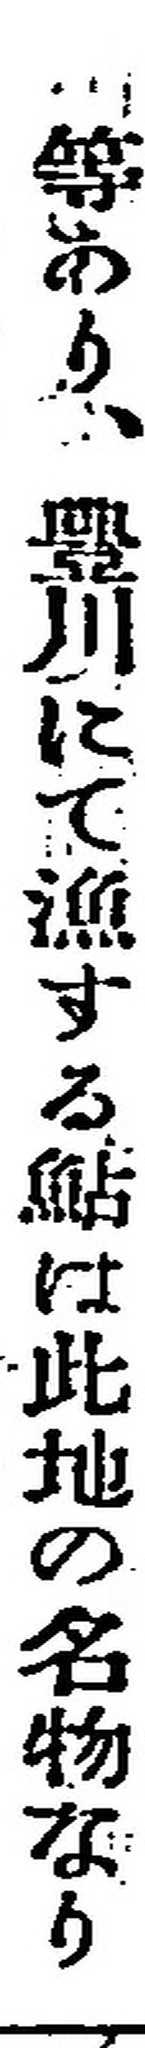等あり、豊川にて漁する鮎は此地の名物なり
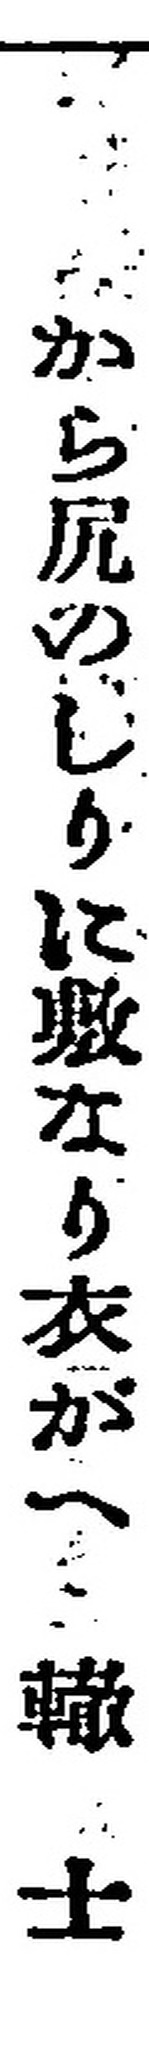から尻のしりに敷なり衣がへ轍士
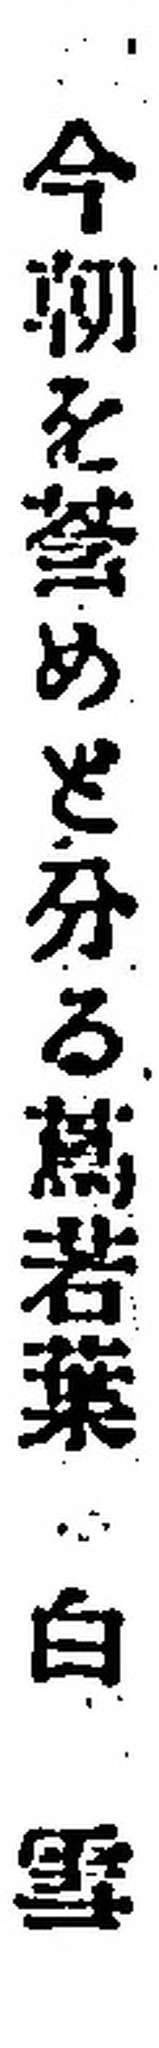今朝を莟めと分る蔦若葉白雪
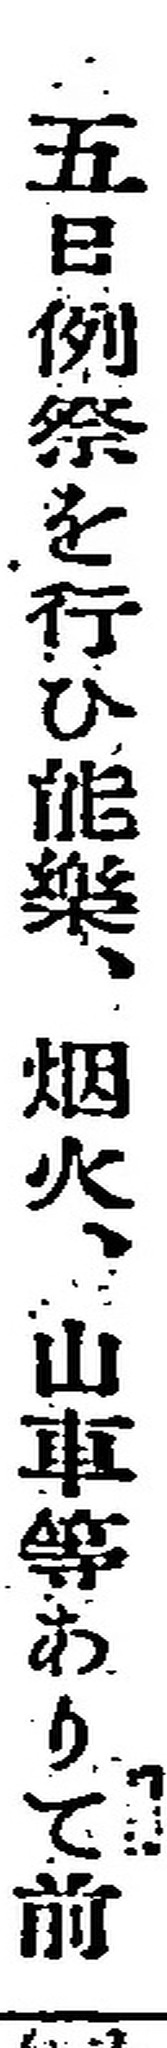五日例祭を行ひ能楽、烟火、山車等ありて前
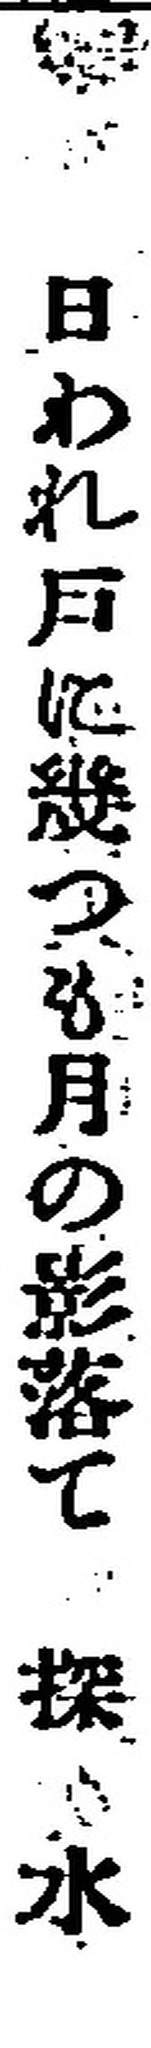日われ戸に幾つも月の影落て探水
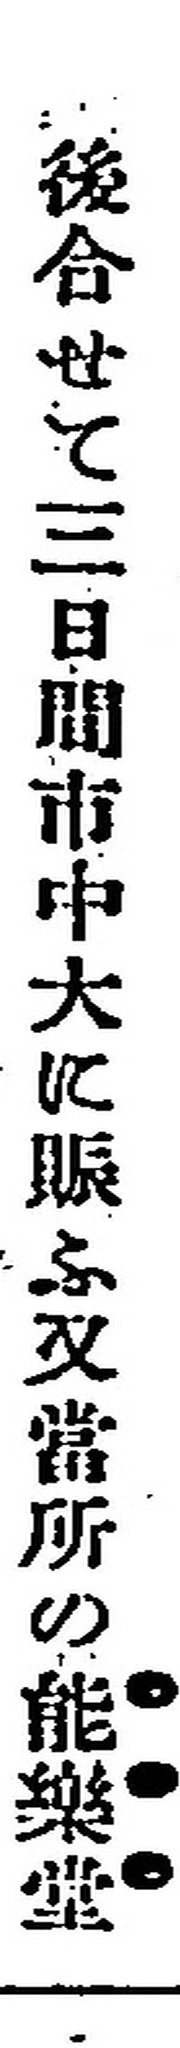後合せて三日間市中大に賑ふ又当所の能楽堂
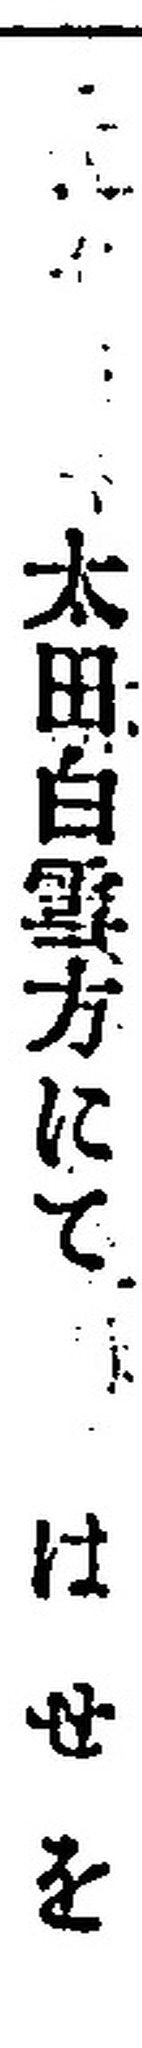太田白雪方にてはせを
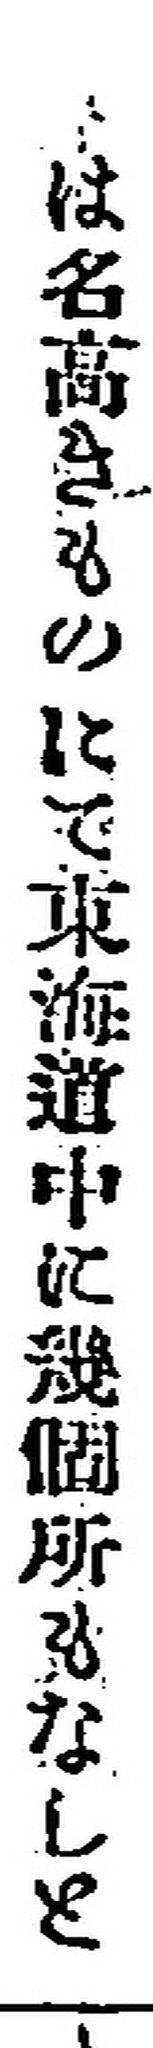は名高きものにて東海道中に幾個所もなしと
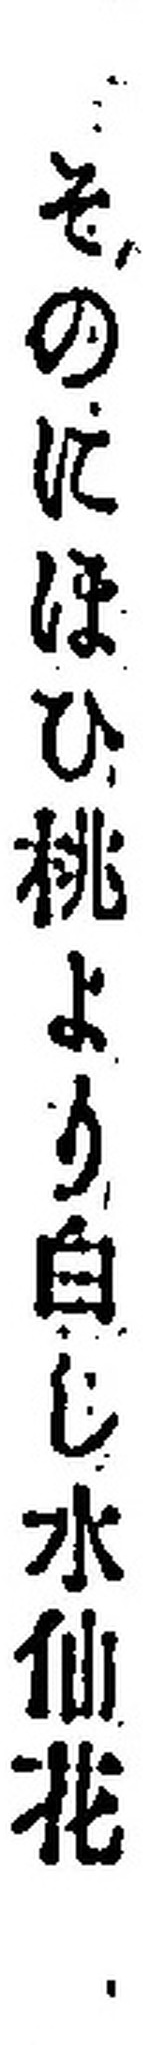そのにほひ桃より白し水仙花
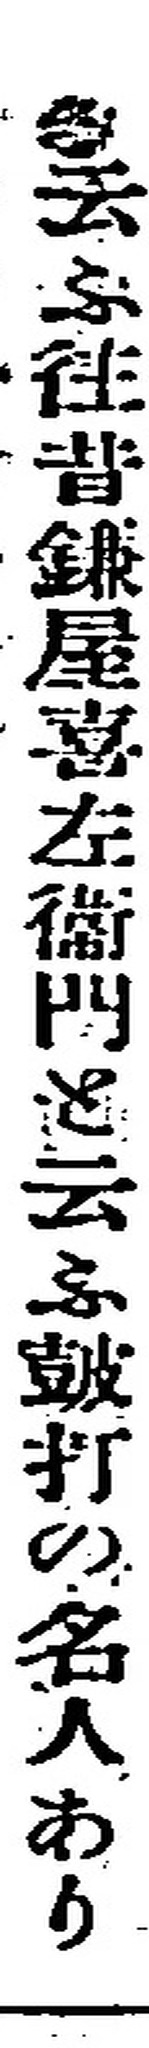云ふ往昔鎌屋喜左衛門と云ふ皷打の名人あり
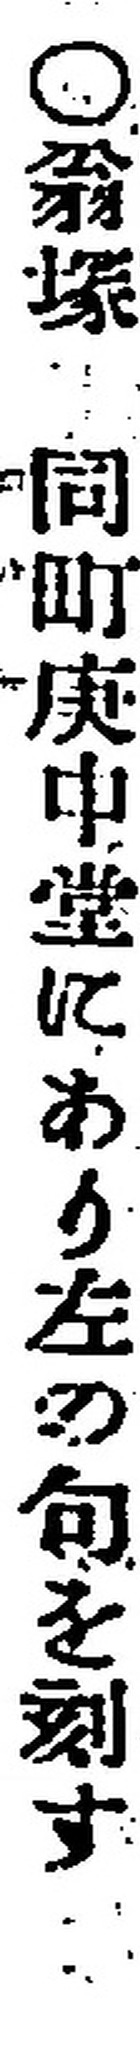○翁塚同町庚申堂にあり左の句を刻す
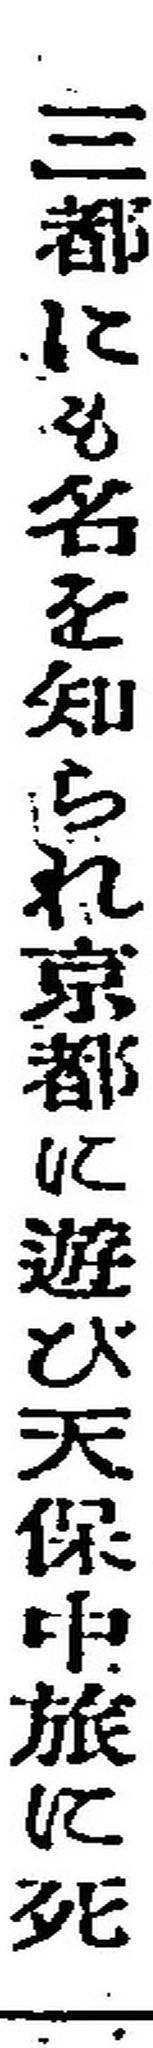三都にも名を知られ京都に遊び天保中旅に死
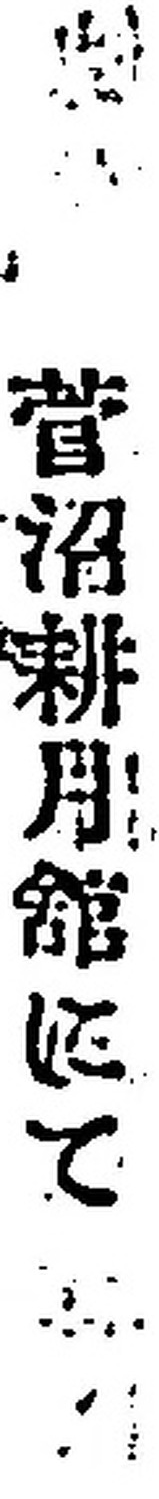菅沼耕月舘にて
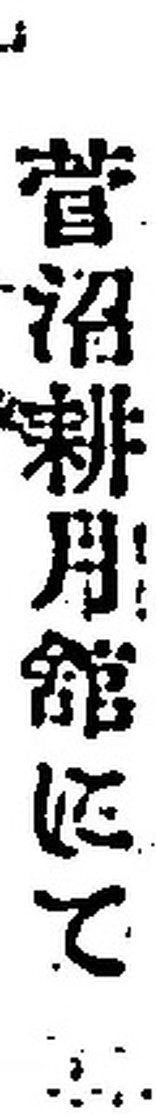菅沼耕月舘にて
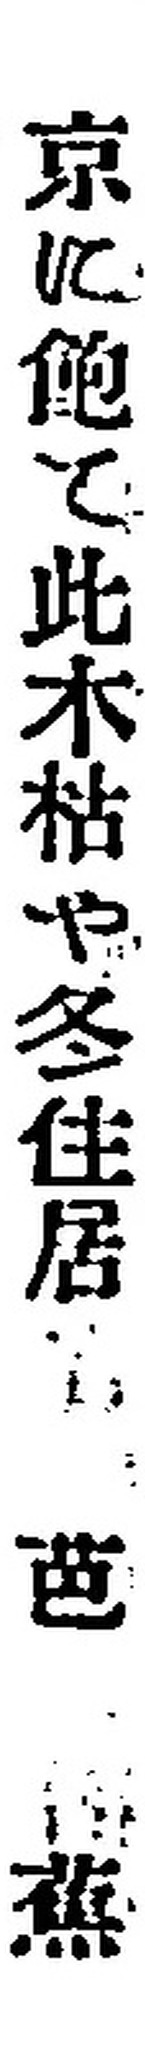京に飽て此木枯や冬住居芭蕉
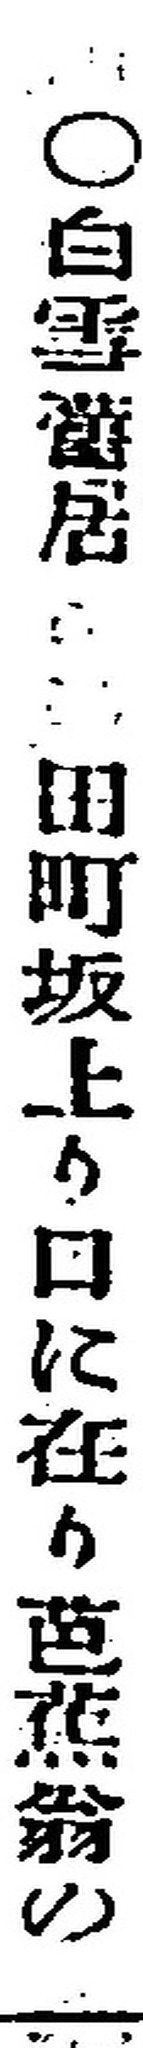○白雪旧居田町坂上り口に在り芭蕉翁の
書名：東参名勝案内
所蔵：国立国会図書館 National Diet Library, JAPAN
